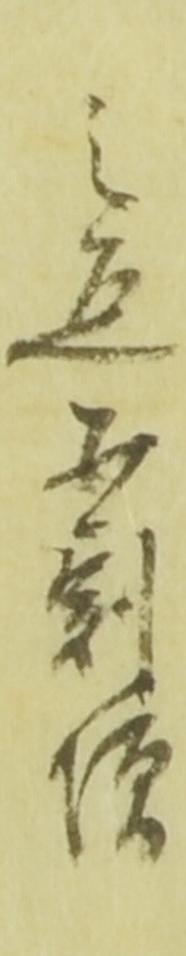之通五割増
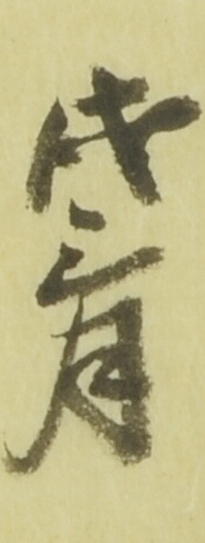戌三月
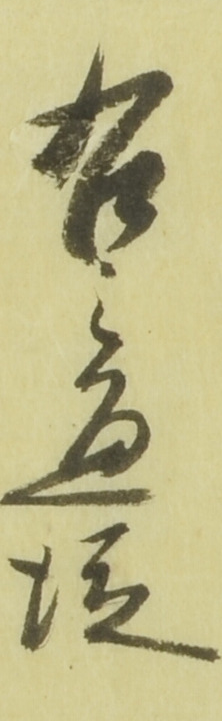右之通従
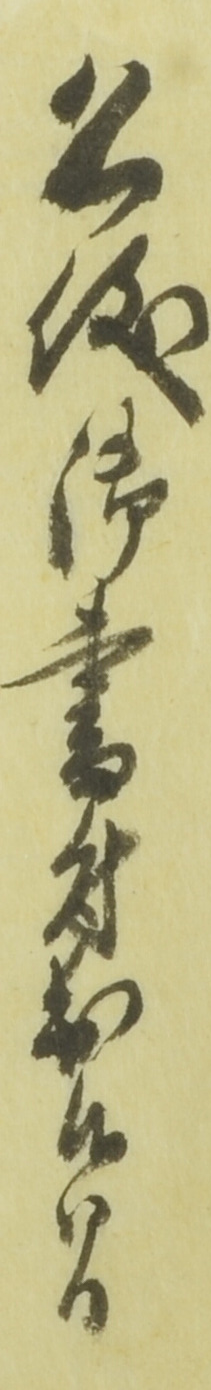公儀御書付出候間
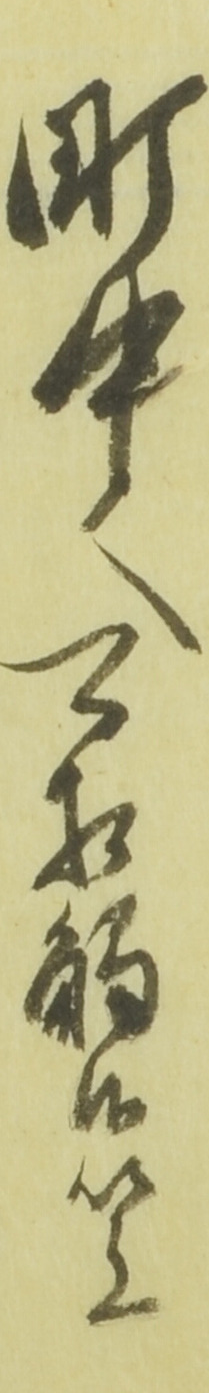町中へ可相触候以上
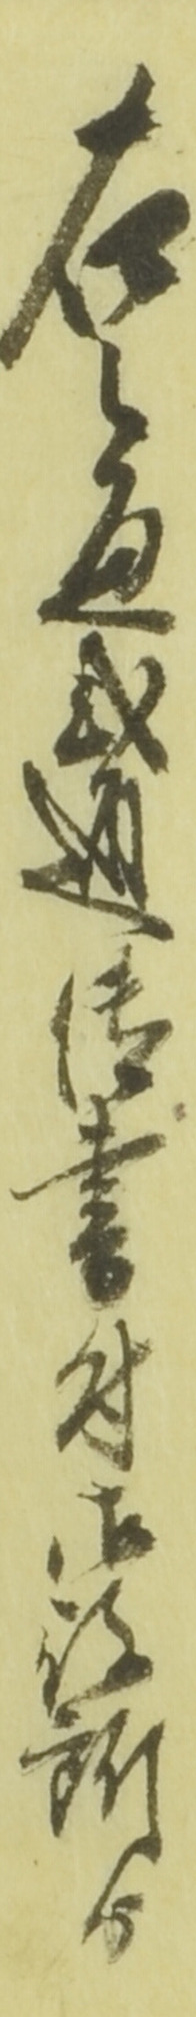右之通弐通御書付御役所ゟ
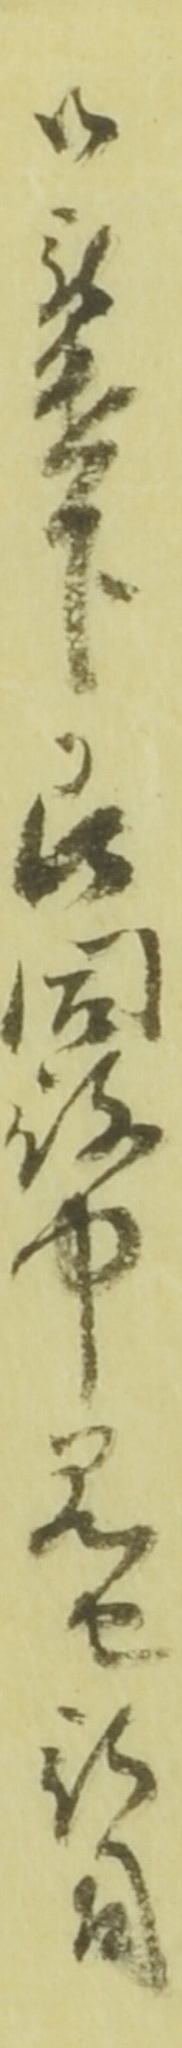御被遣下即同役中見セ行司
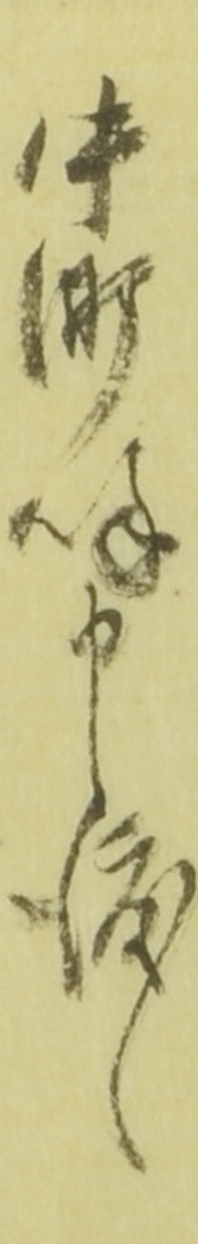中町呼申渡候

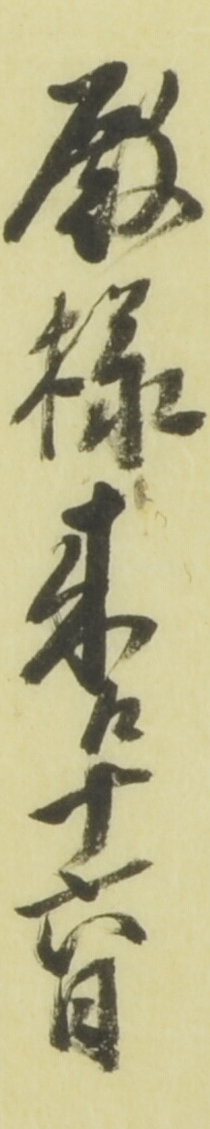殿様来ル十六日
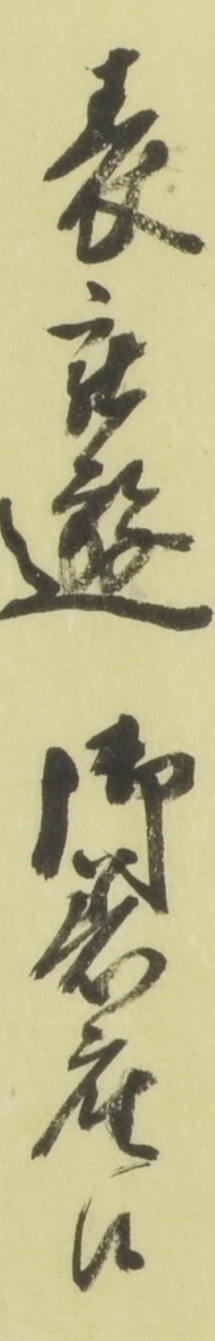表被遊御着座候
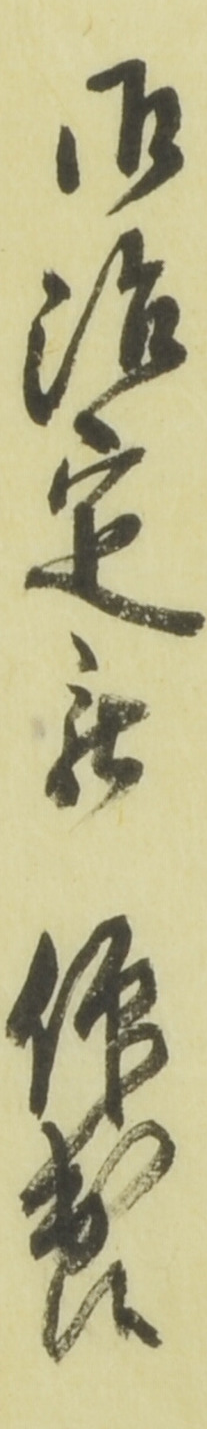御治定被仰出候
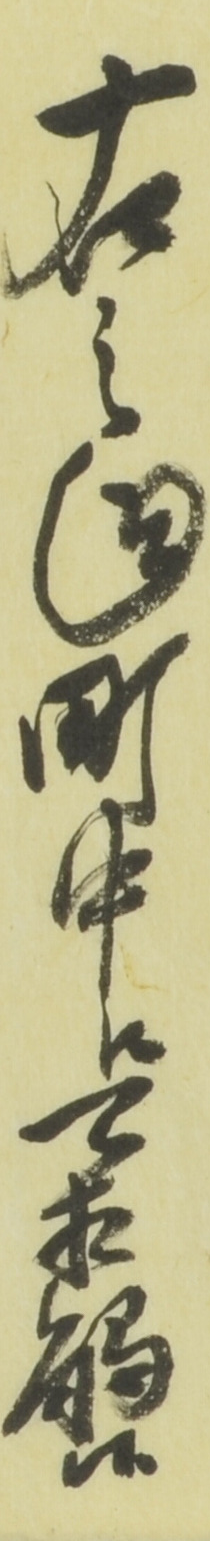右之趣町中江可相触候
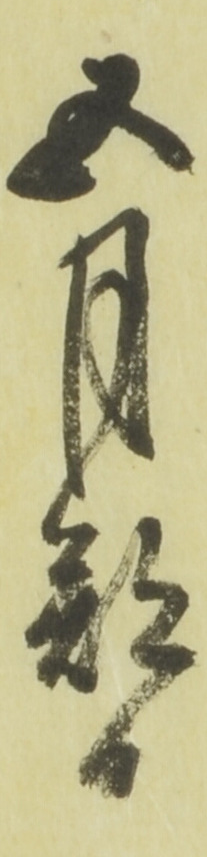五月朔日
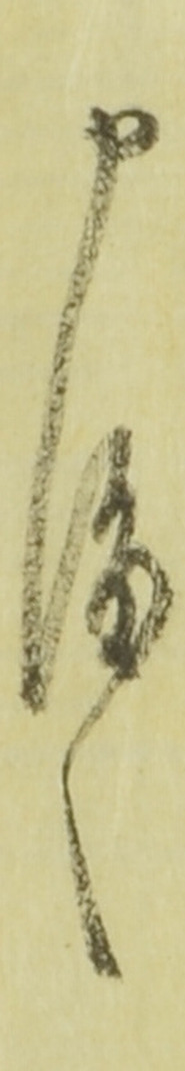申渡候
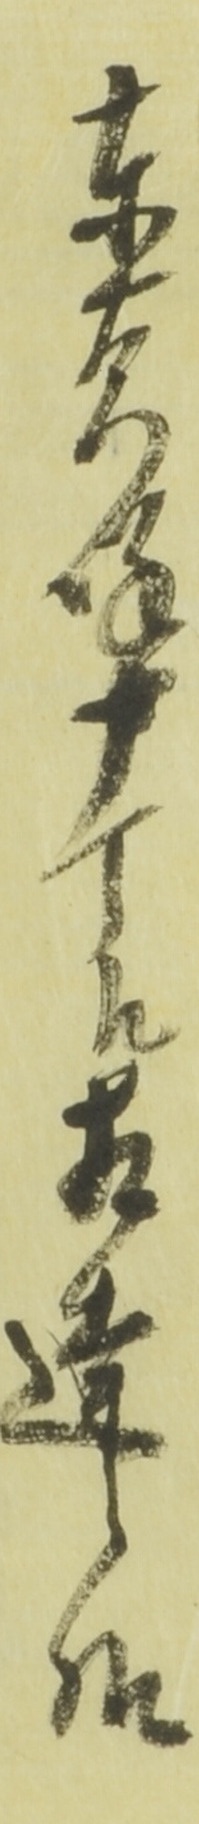東右衛門呼十丁江相違候様
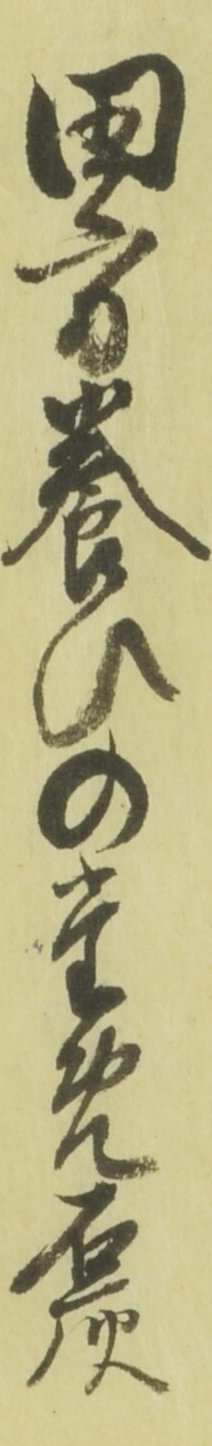田方養ひのため石灰
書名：御触書御書附控
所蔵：伊那市立高遠町図書館・合同会社AMANE
